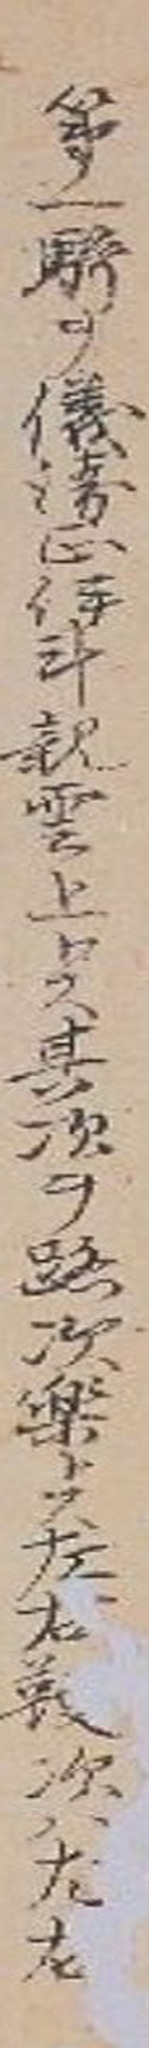第一騎ヲ儀衛正伊斗親雲上トス其次ヲ路次楽トス左右次ハ左右
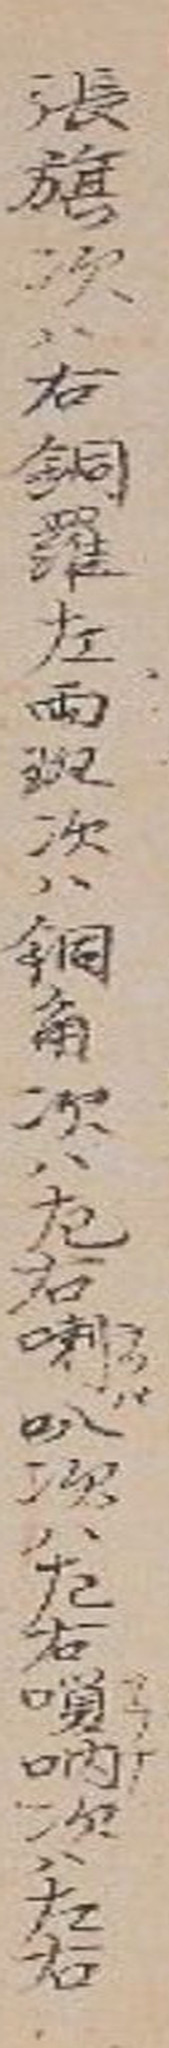張旗次ハ右銅鑼左両班次ハ銅角次ハ左右喇叭次ハ左右哨吶次ハ左右
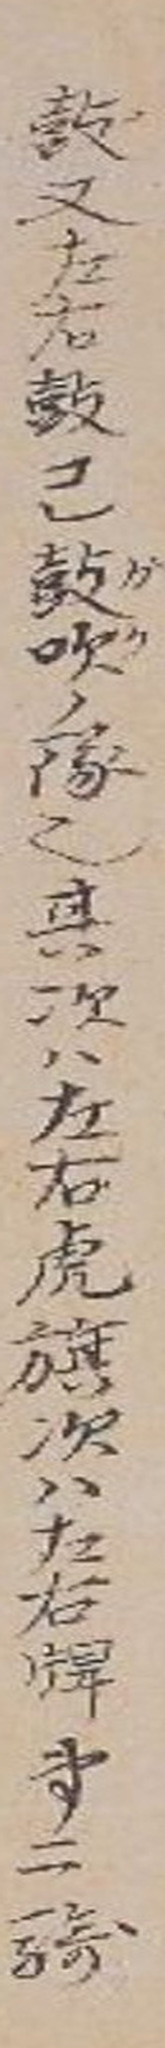鼓又左右鼓コレ鼓吹ノ隊也其次ハ左右虎旗次ハ左右牌第二騎
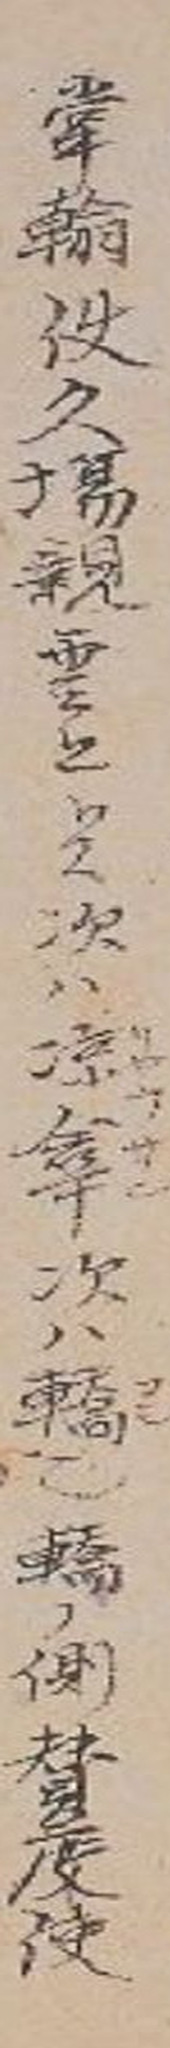掌翰杖久場親雲上トス次ハ涼傘次ハ轎也轎ノ側賛度使
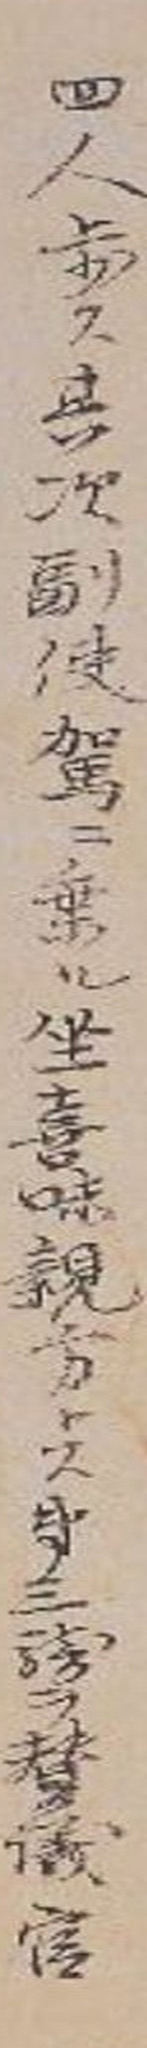四人歩ス其次副使駕ニ乗ル坐喜味親方トス第三騎ヲ賛議官
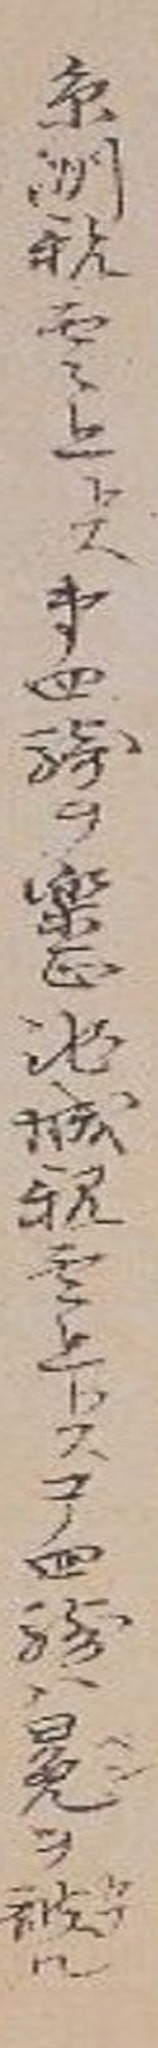糸州親雲上トス第四騎ヲ楽正池城親雲上トスコノ四騎ハ冕ヲ被ル
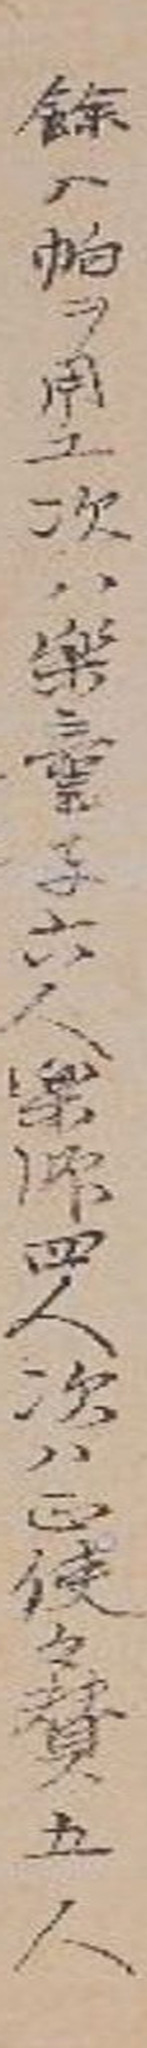余ハ帕ヲ用ユ次ハ楽童子六人楽師四人次ハ正使々賛五人
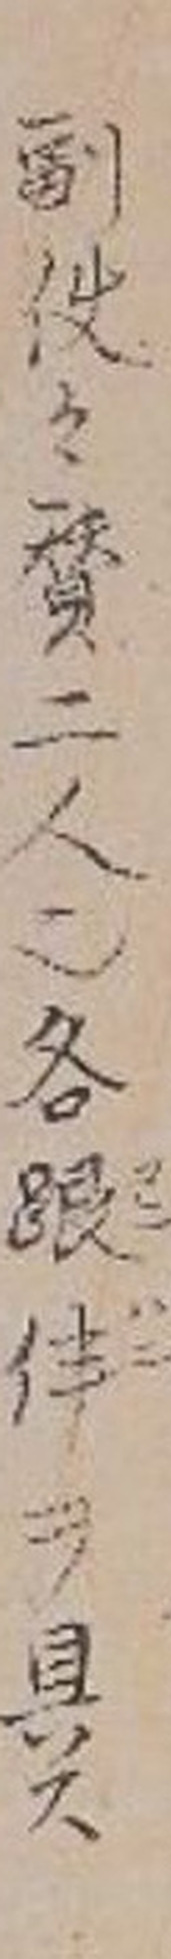副使々賛二人也各跟伴ヲ具ス
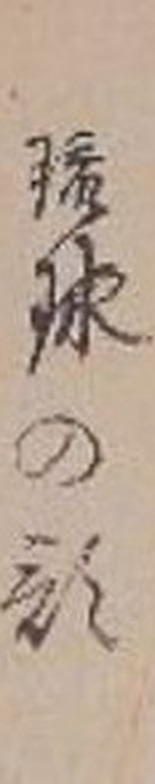琉球の歌

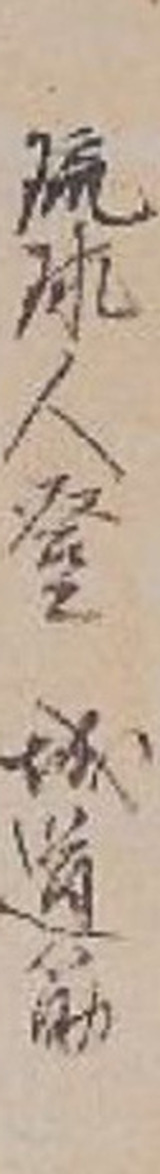琉球人登城道筋
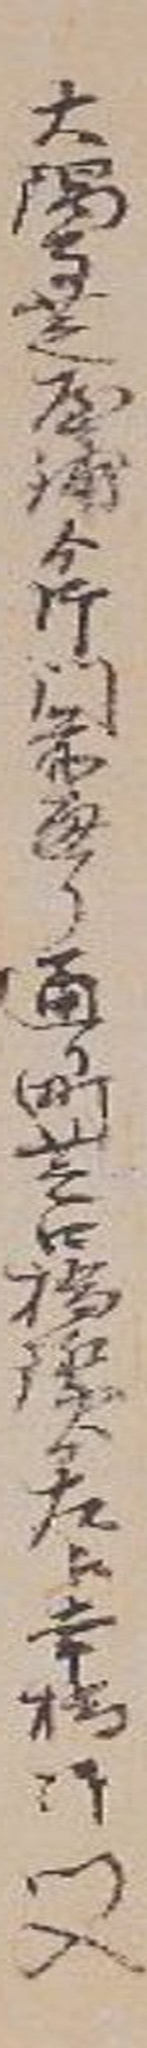大隅守芝屋鋪ゟ御門前通り通り町芝口橋際ゟ左え幸橋御門入
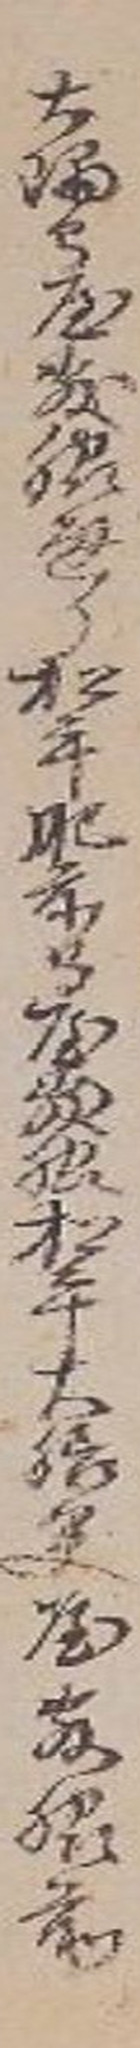大隅守屋敷脇通り松平肥前守屋敷脇松平大膳大夫屋敷脇前
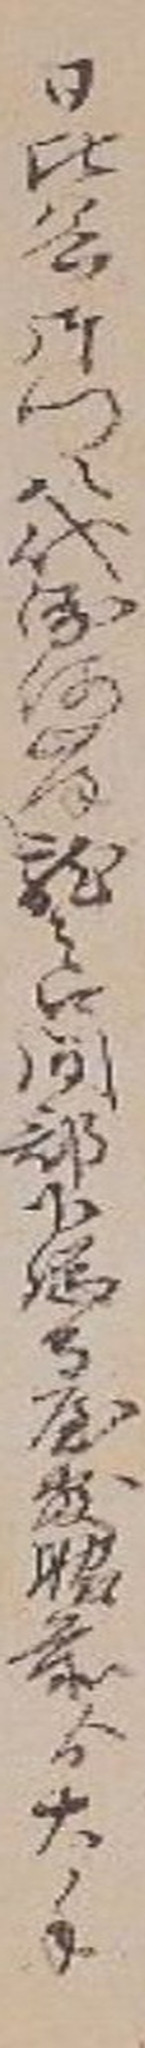日比谷御門八代洲河岸龍之口間部下総守屋敷脇前ゟ大手
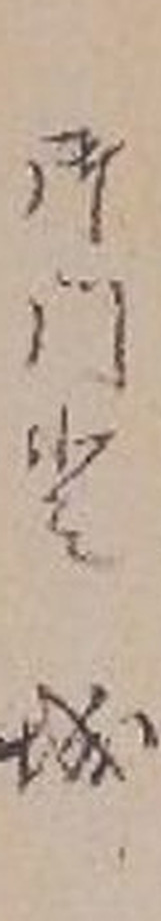御門登城
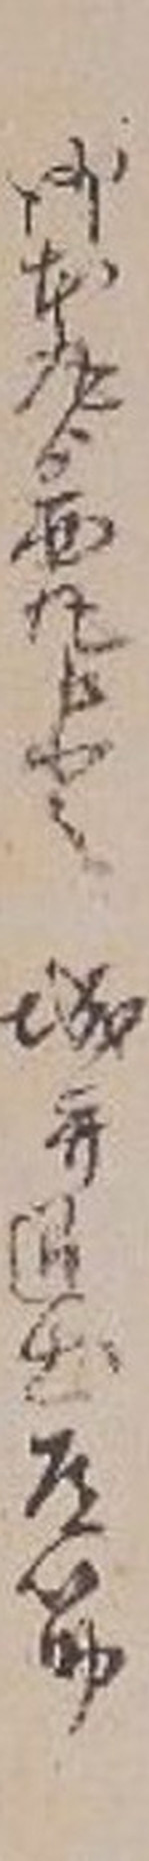御本丸ゟ西丸え登城幷退出道筋
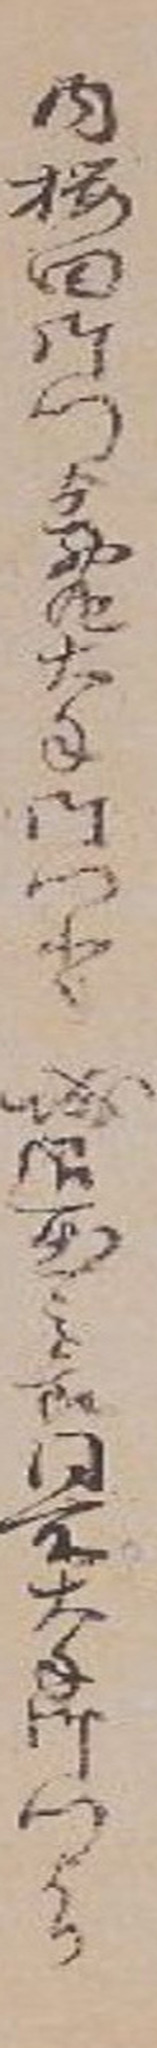内桜田御門ゟ西丸大手門登城退出之節同所大手御門より
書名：琉球来聘志(仮) 天保十三年
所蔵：University of the Ryukyus Library
